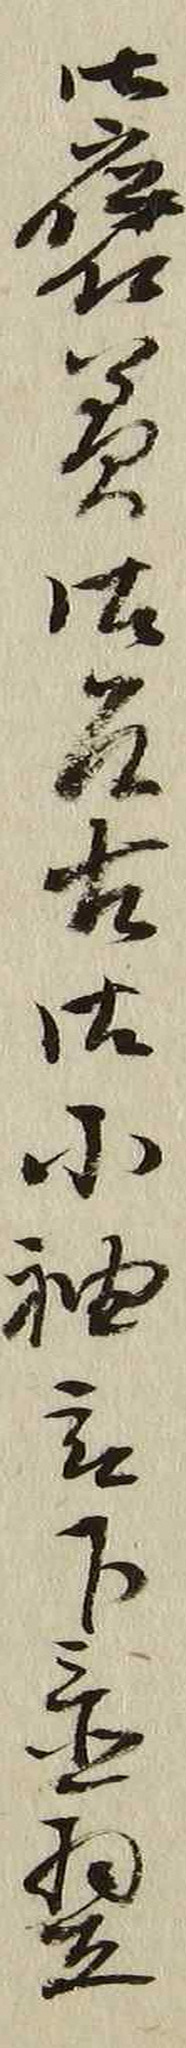御褒美御召古御小袖被下置翌
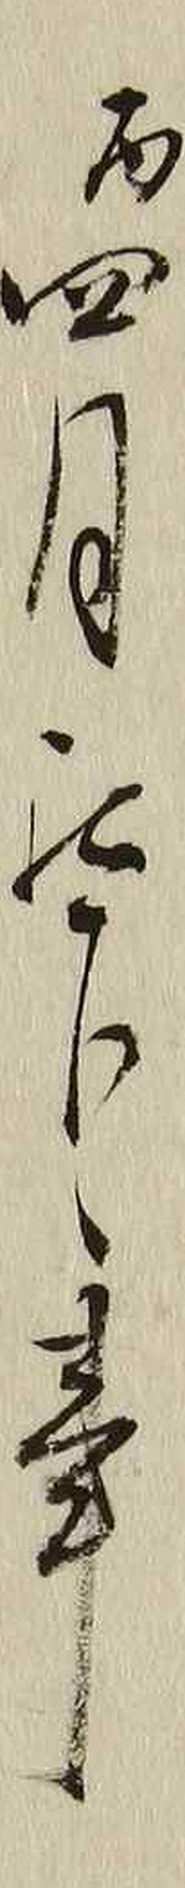酉四月罷下候事
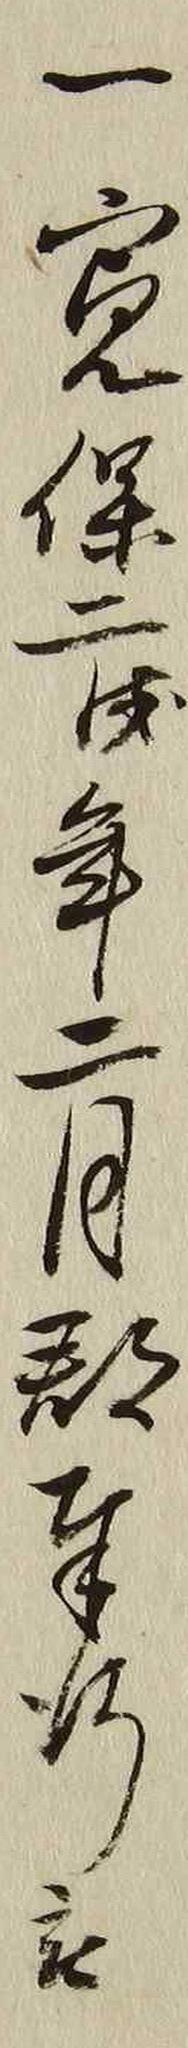一寛保二戌年二月郡奉行被
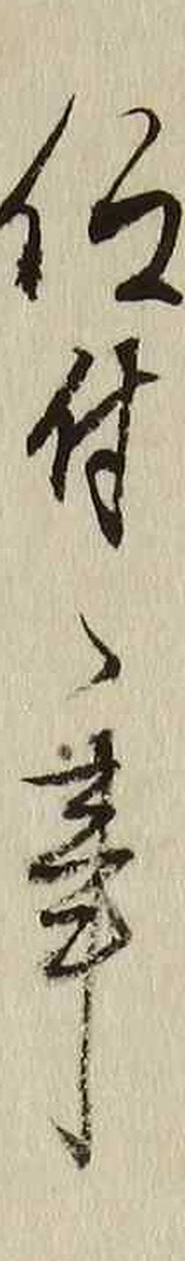仰付候事
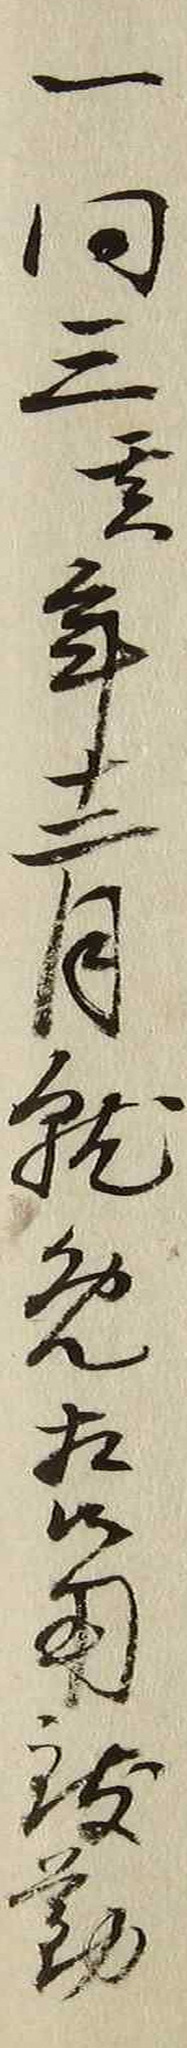一同三亥年十二月就免相御用致勤
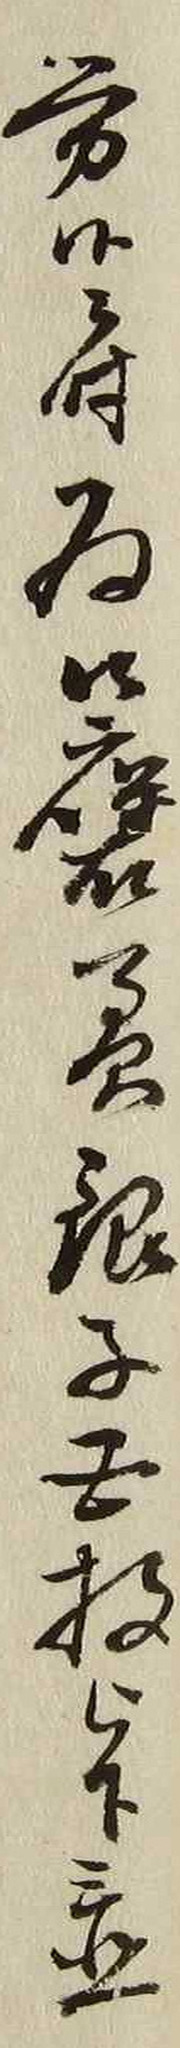労候ニ付為御褒美銀子五枚被下置
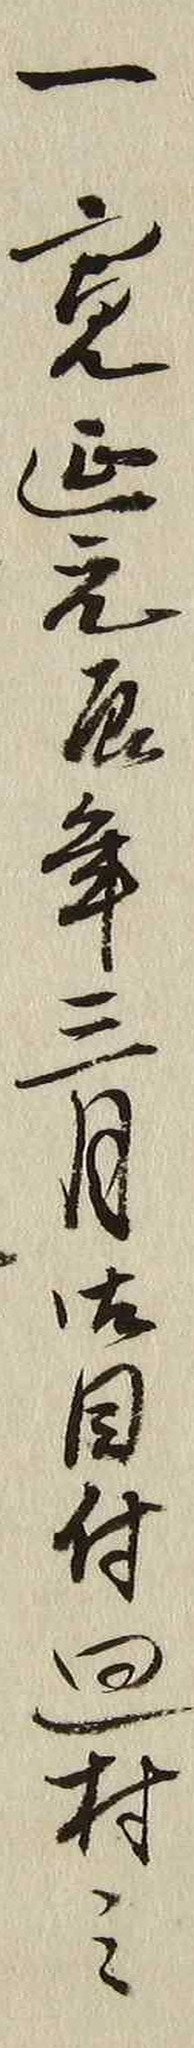一寛延元辰年三月御目付廻村之
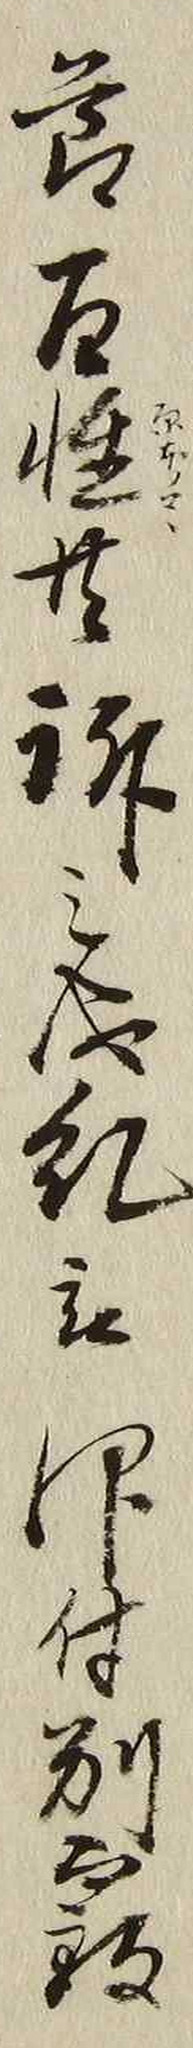節百性共訴之儀糺被仰付別而致
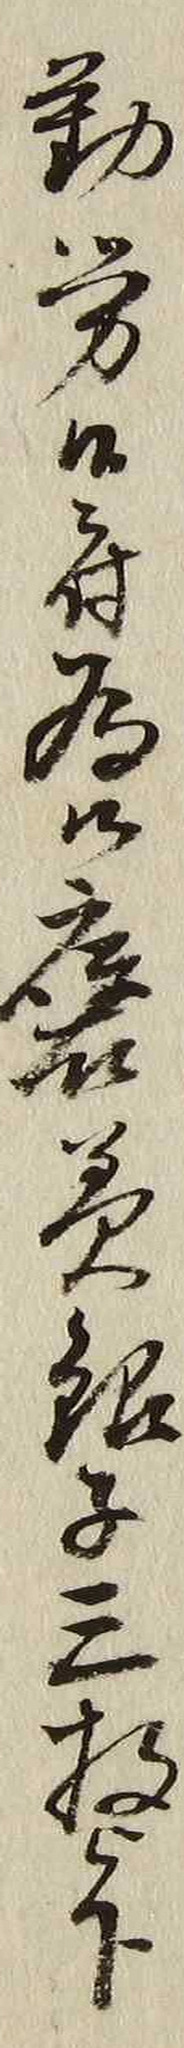勤労候ニ付為御褒美銀子三枚被下
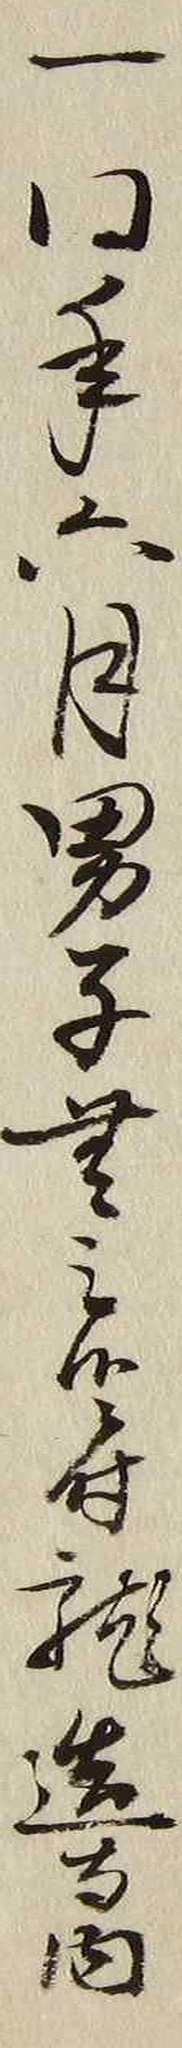一同年六月男子無之候ニ付龍造寺内
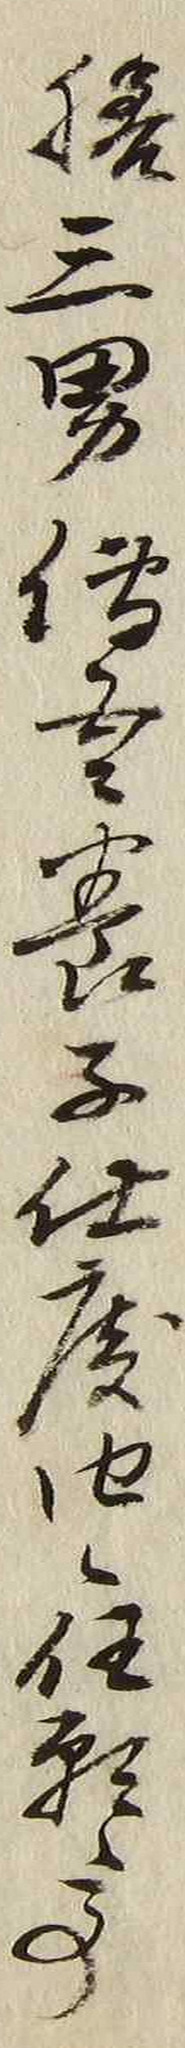膳三男伝吾養子仕度由被任願候事
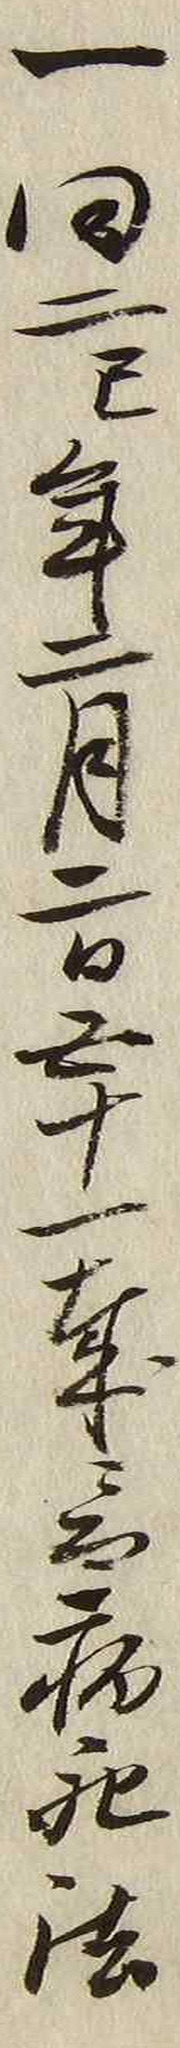一同二巳年二月二日五十一歳ニ而病死法
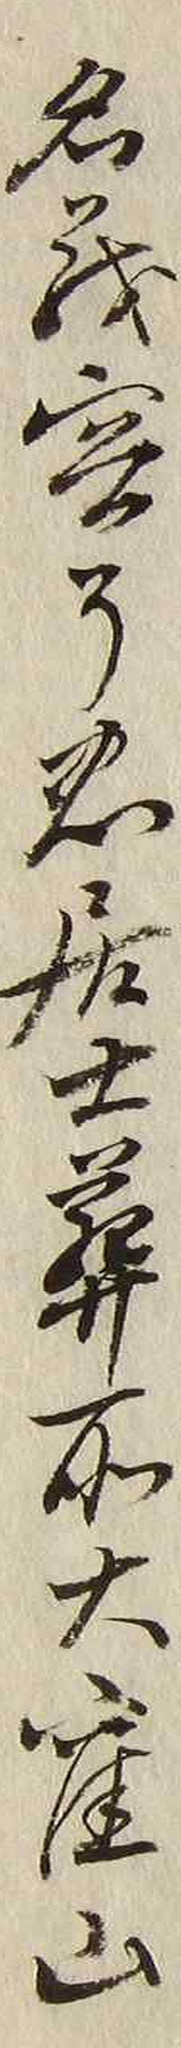名茂容了忠居士葬所大窪山

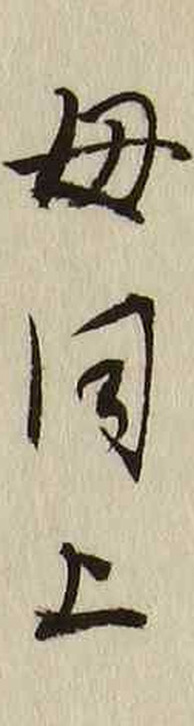母同上
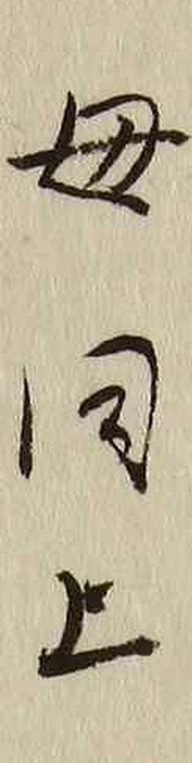母同上
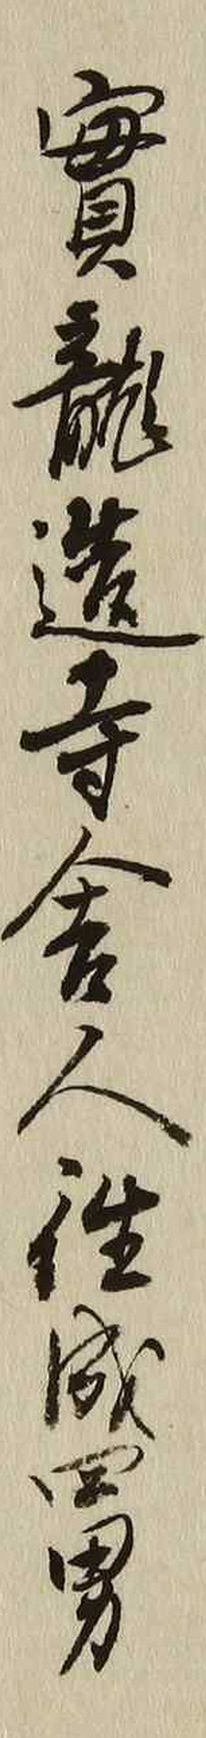実龍造寺舎人往成四男
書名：諸士系譜　巻之352　す之部2
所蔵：会津若松市立会津図書館
